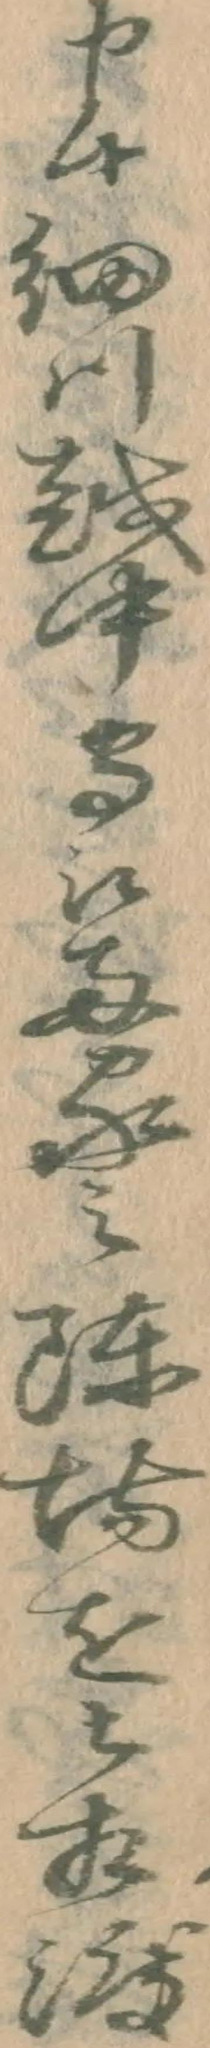申候細川越中守江両家之陣場を被相渡
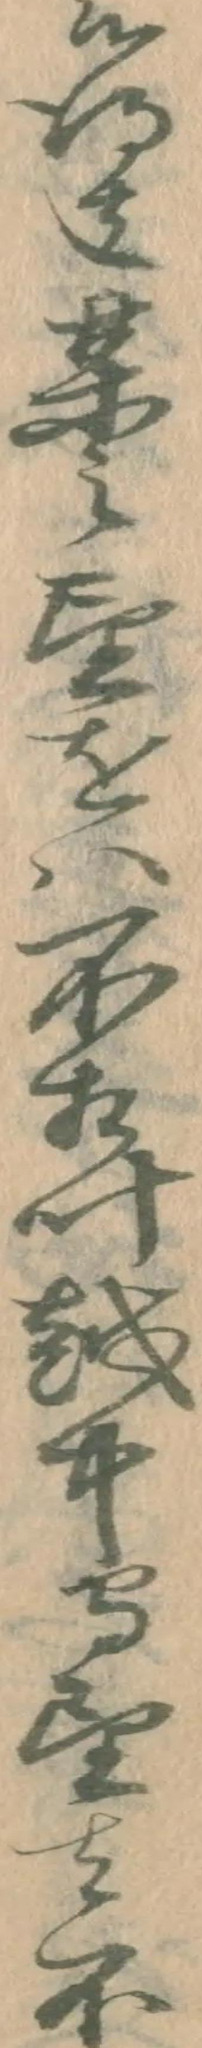候得者某之望をは不相叶越中守望者不
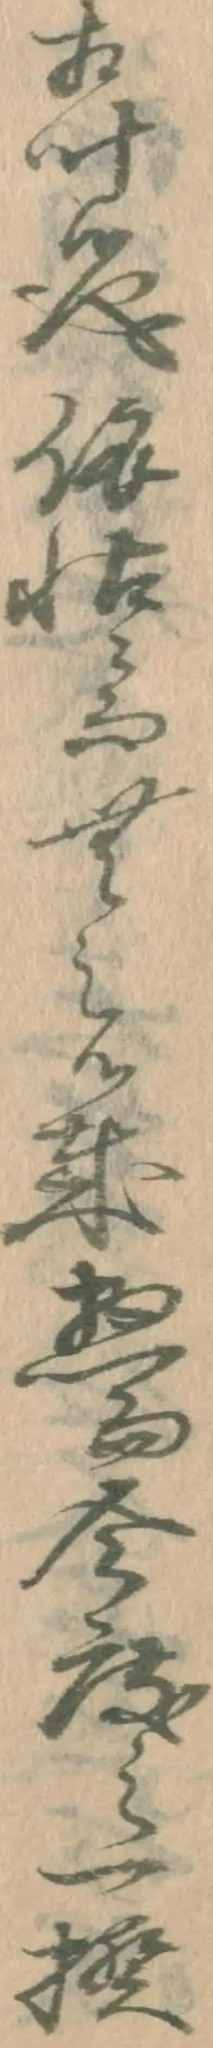相叶候儀依怙に而無之候成惣而今度之一揆

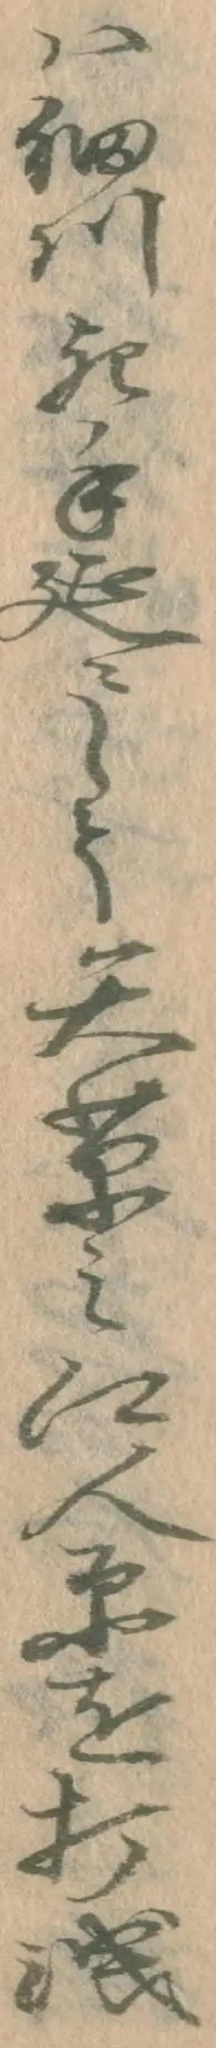は細川歟手延にして天草之郷人原を打洩
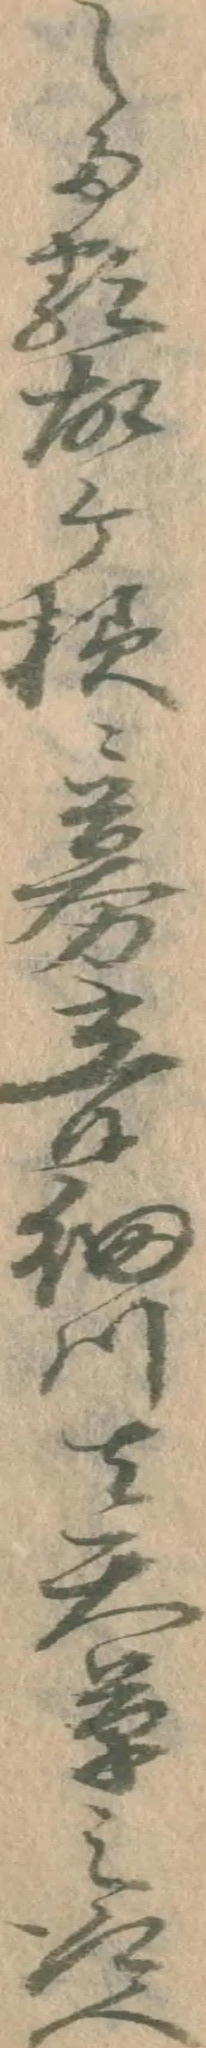し多類故け様に募立候細川者天草之郷人
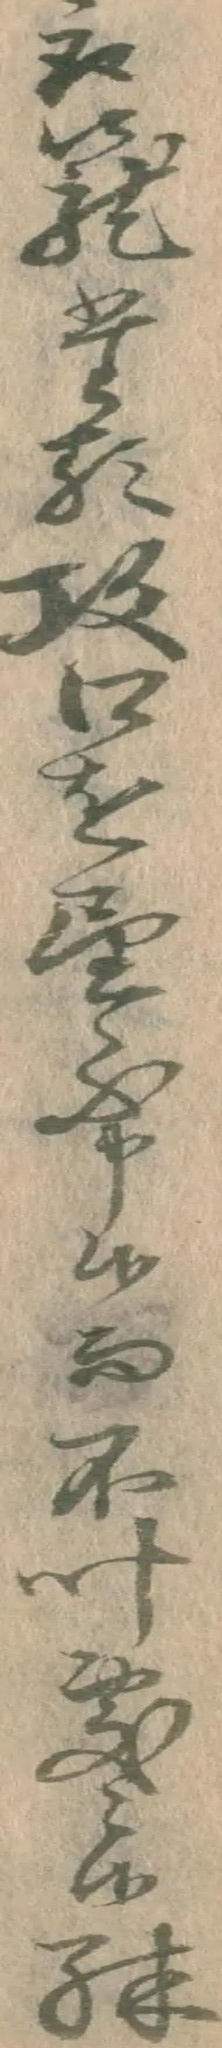取籠堂類攻口を届ふ申候而不叶處に候殊
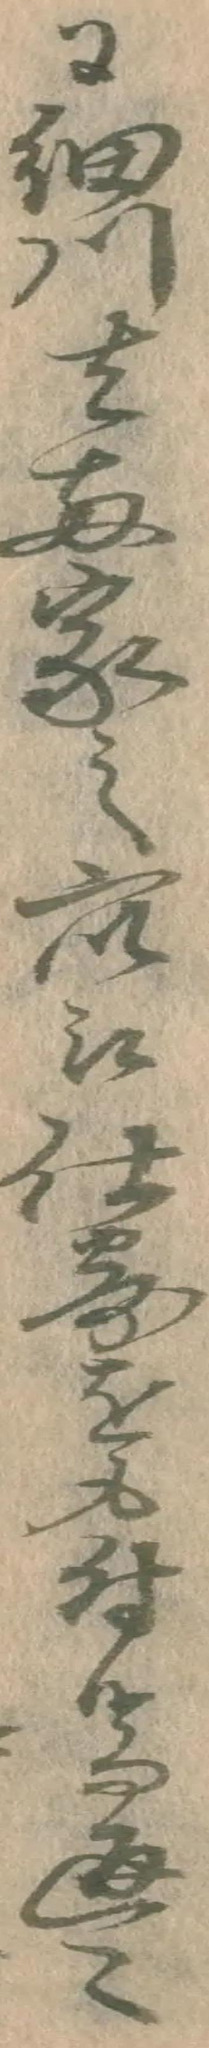尓細川者両家之衆江仕寄をも付候而返々
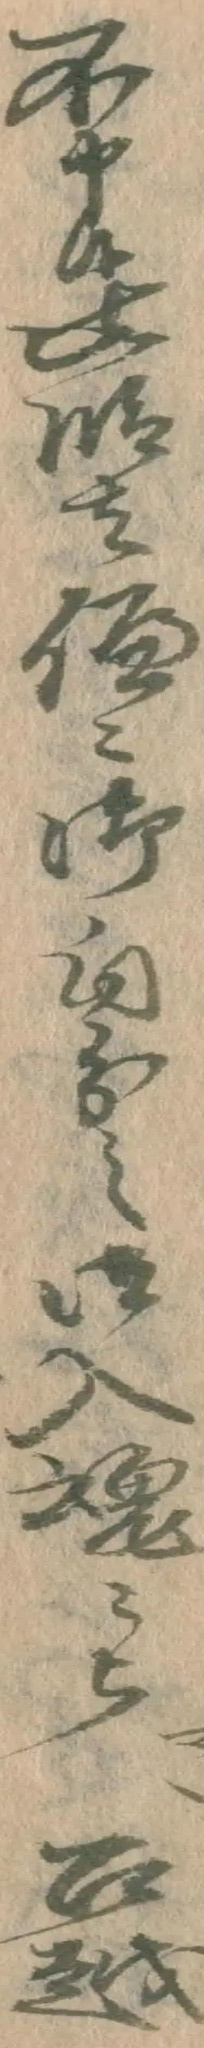不申候此段者偏に御自分之御入魂に被召越
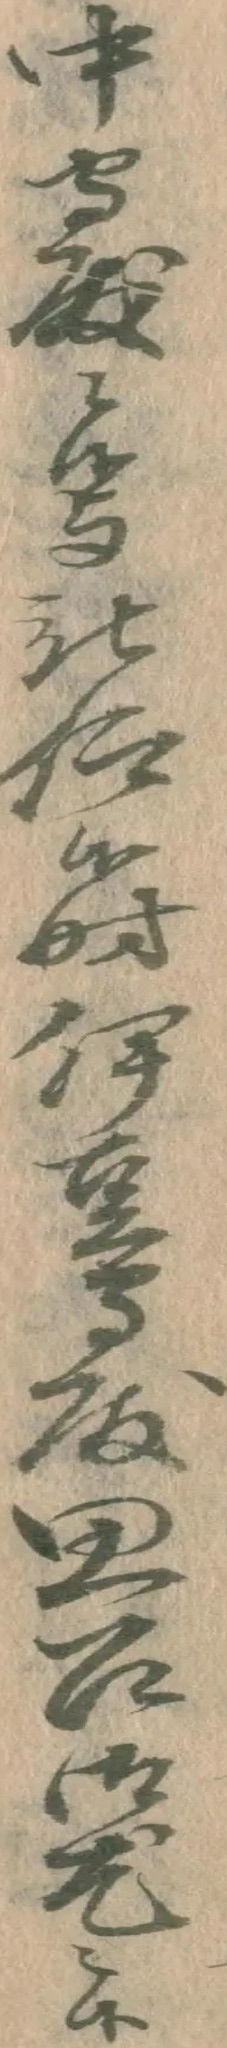中守殿に候与被仰候時伊豆守殿思召御尤に候
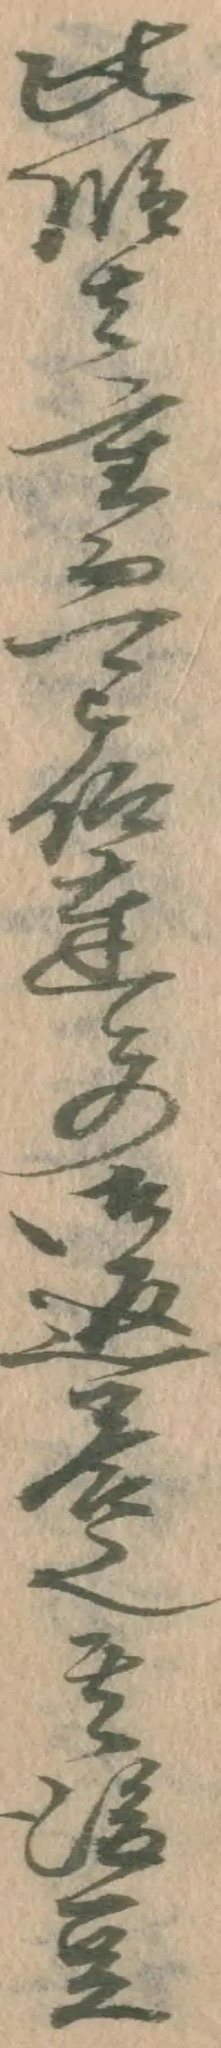此段者重而可被仰達との御返答也其後豆
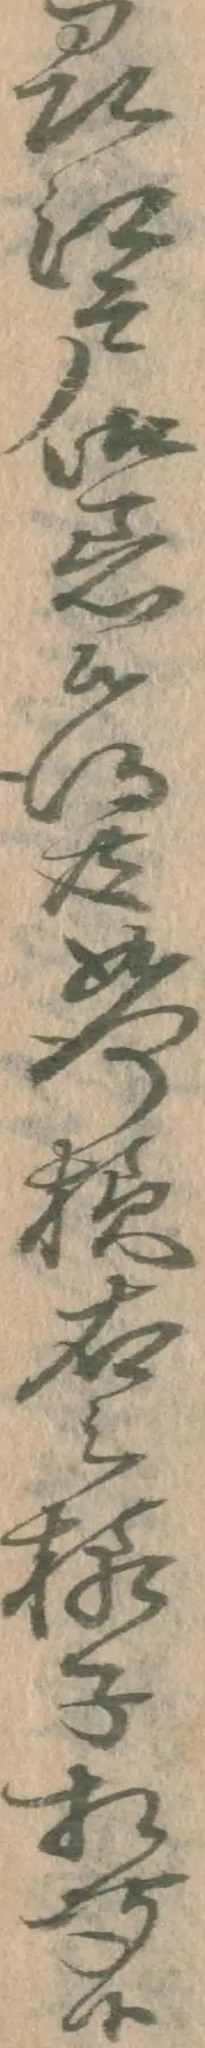州江戸御着候得共如何様右之様子相聞候
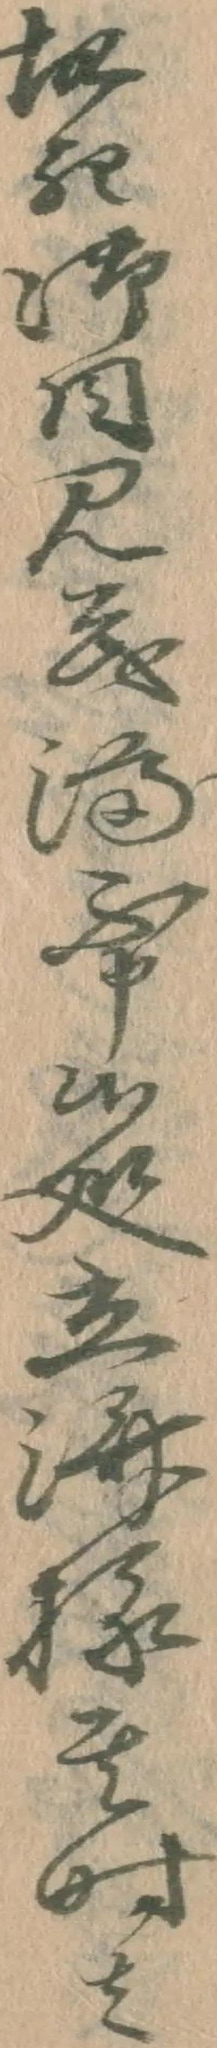故歟御目見茂備ふ申候処立済様其時者
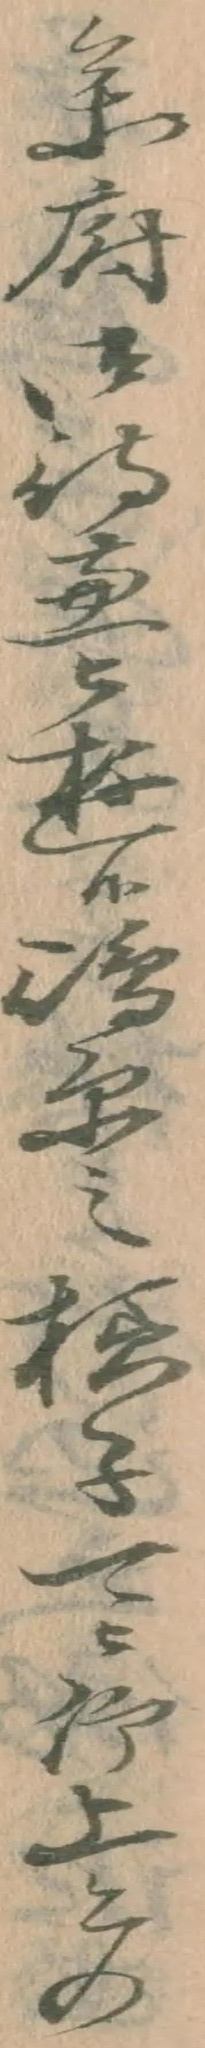参府御待兼被遊候島原之様子可被仰上との
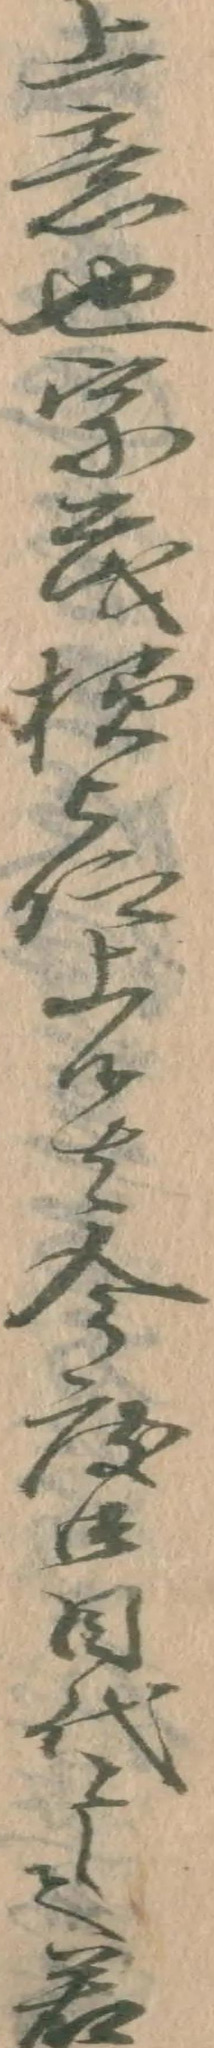上意也宗茂様被仰上候者今度御目代として若
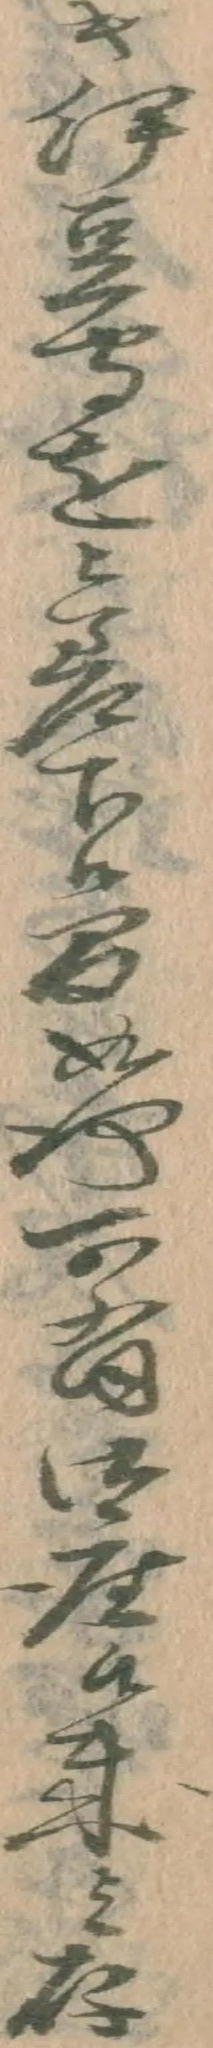き伊豆守を被差下候間如何可有御座候成与存
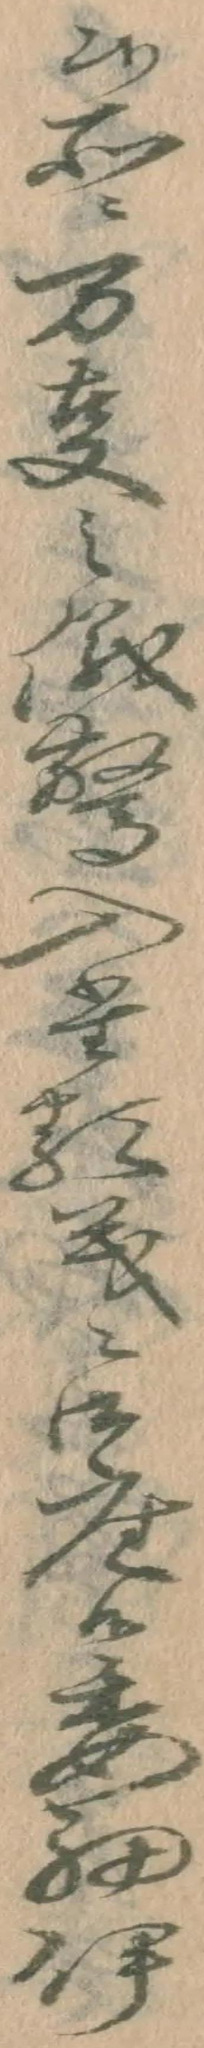候所に万事之儀驚入堂類儀義に御座候委細伊
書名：切支丹御退治記 49巻. [8]
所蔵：国立国会図書館 National Diet Library, JAPAN
